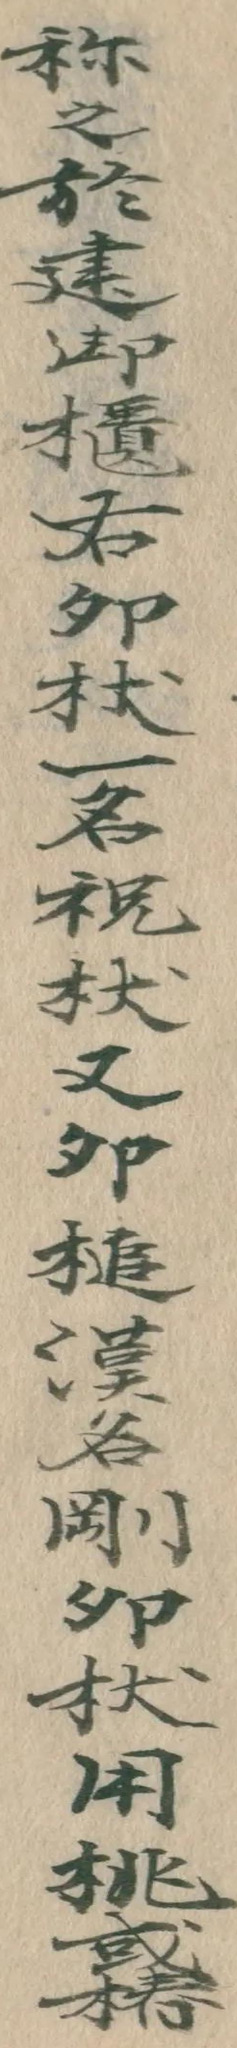称之於建御櫃右卯杖一名祝杖又卯槌漢名剛卯杖用桃或椿
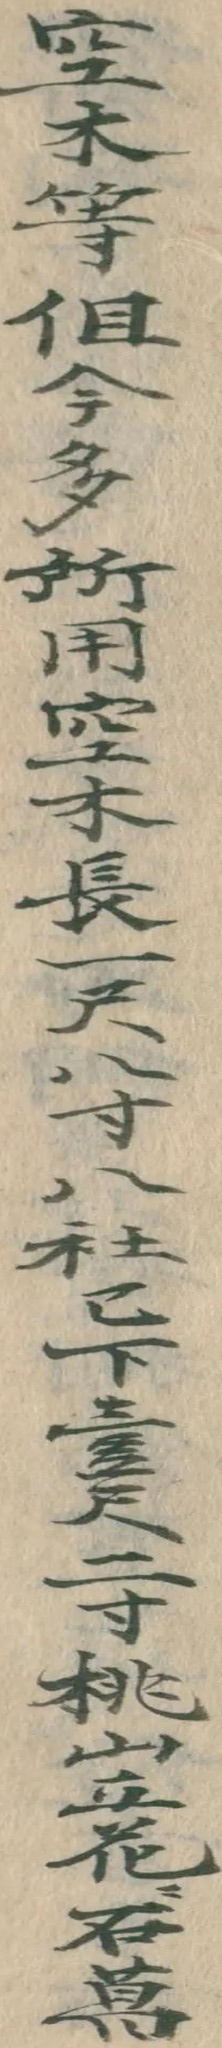空木等但今多所用空木長一尺八寸八社已下壱尺二寸桃山立花ニ石菖
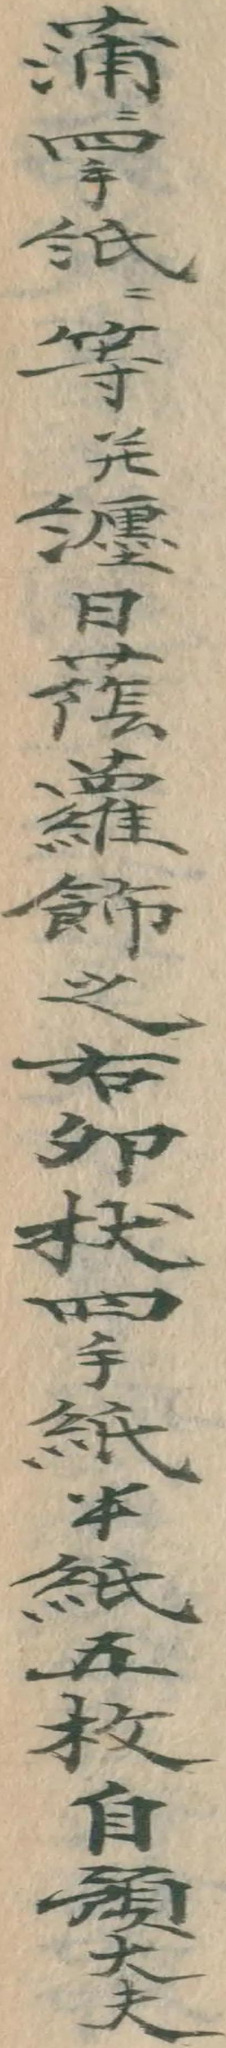蒲ニ四手紙ニ等并纏日蔭羅飾之右卯杖四手紙半紙五枚自預大夫

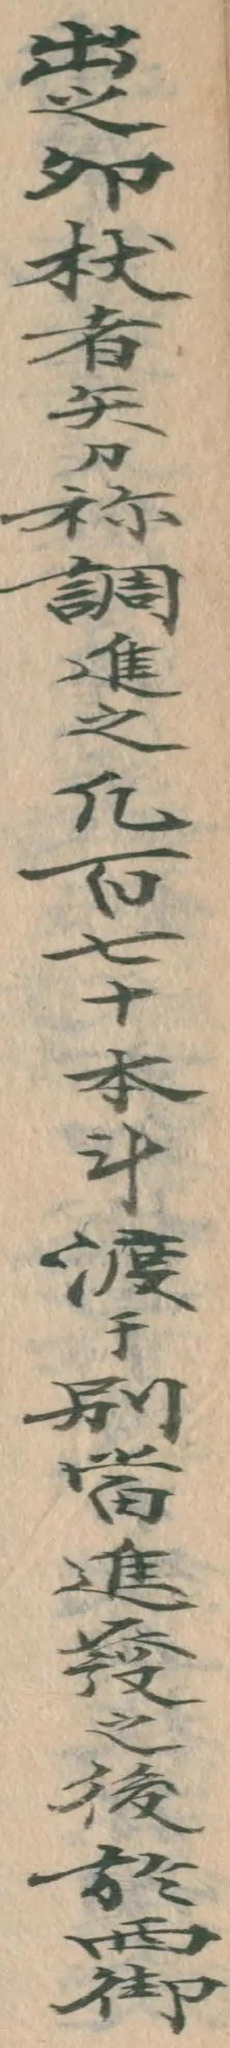出之卯杖者矢刀祢調進之凡百七十本計渡于別当進発之後於西御
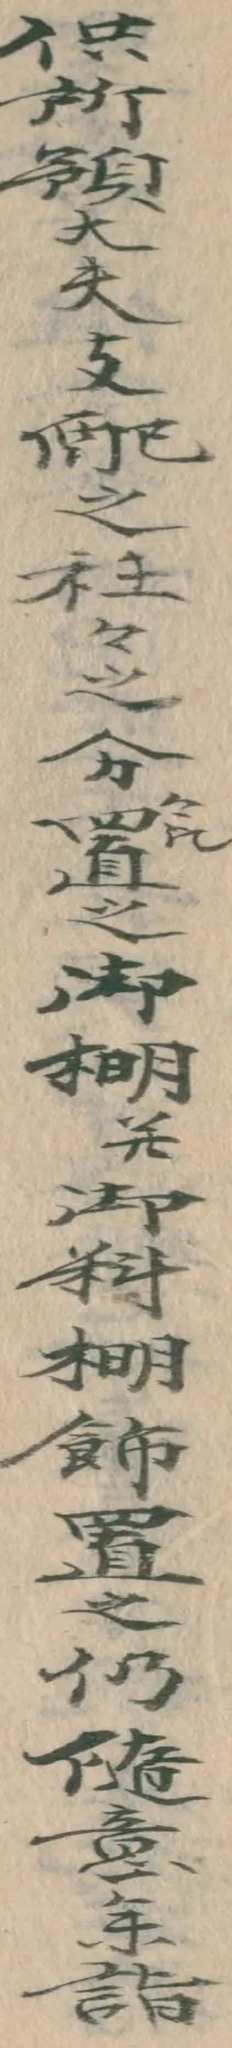供所預大夫支配之社々之分置之御棚并御料棚飾置之仍随意参詣
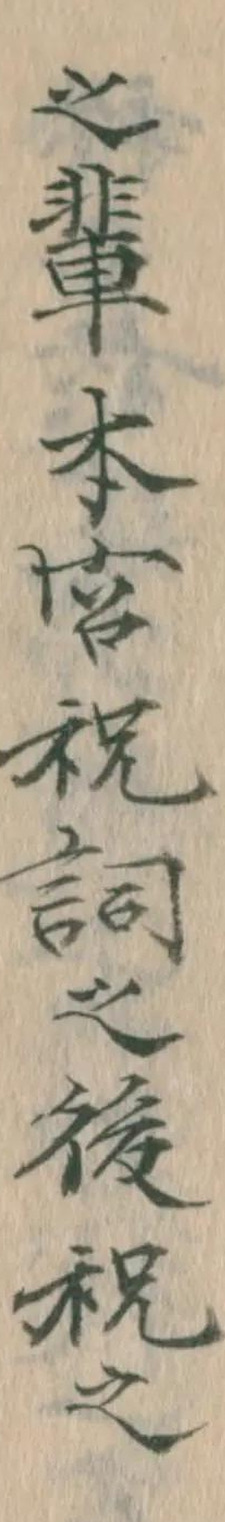之輩本宮祝詞之後祝之
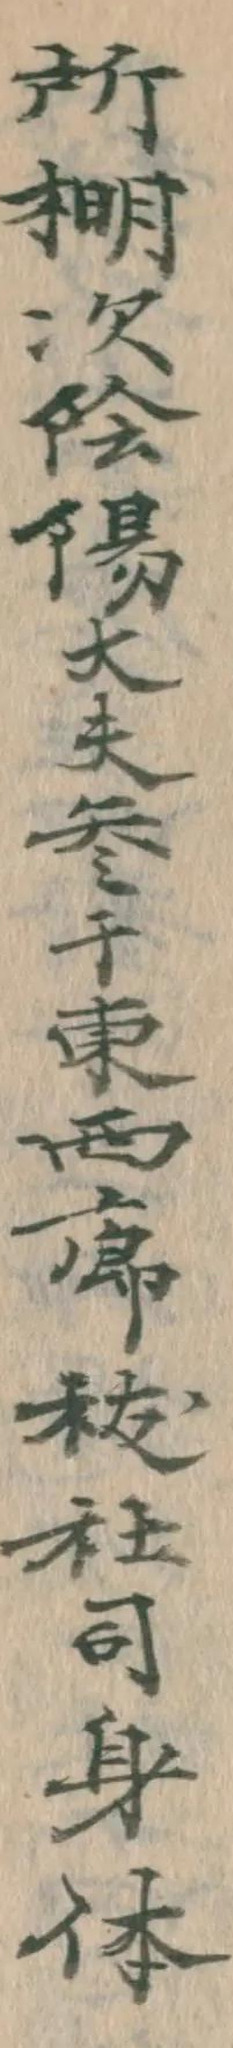所棚次陰陽大夫参于東西廊祓社司身体
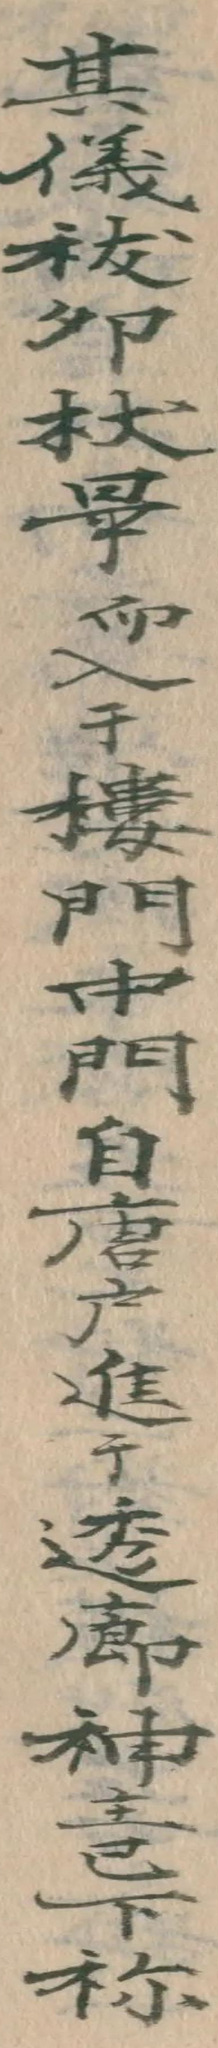其儀祓卯杖畢而入于楼門中門自唐戸進于透廊神主已下祢
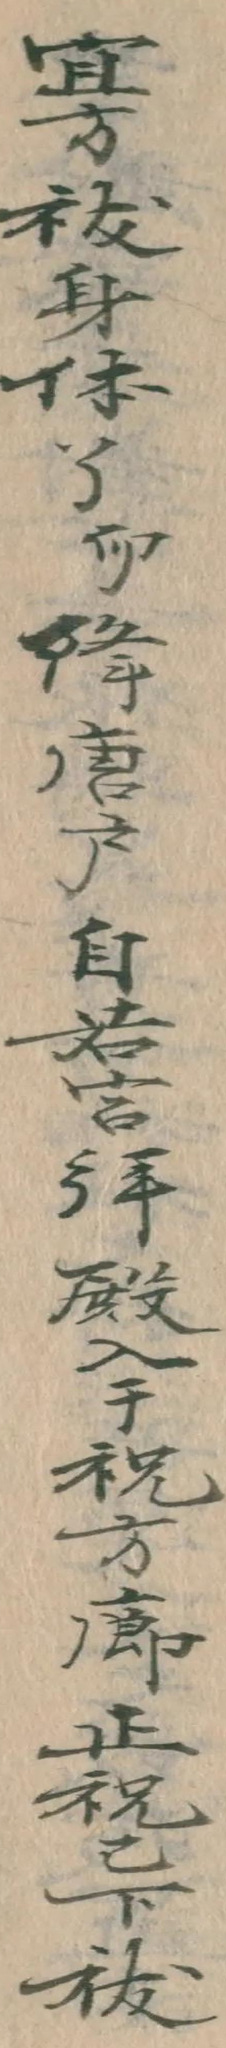宜方祓身体了而降唐戸自若宮拝殿入于祝方廊正祝已下祓
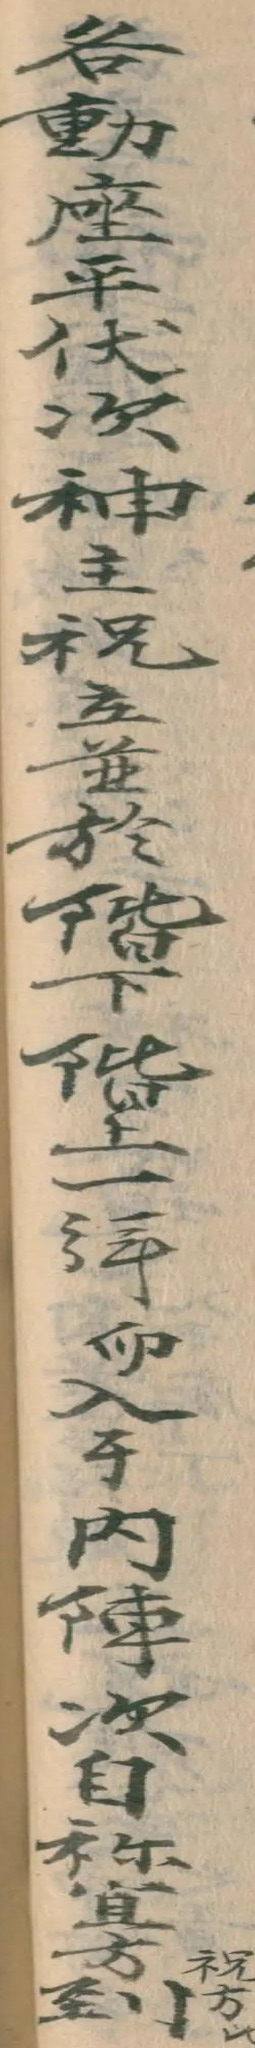各動座平伏次神主祝立並於階下階上一拝而入于内陣次自祢宜方到
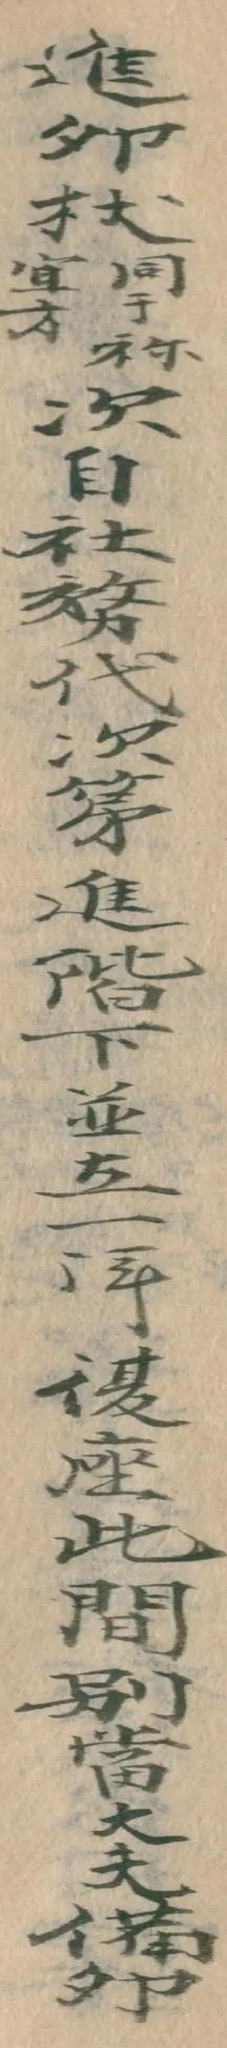進卯杖同于祢宜方次自社務代次第進階下並立一拝復座此間別当大夫備卯
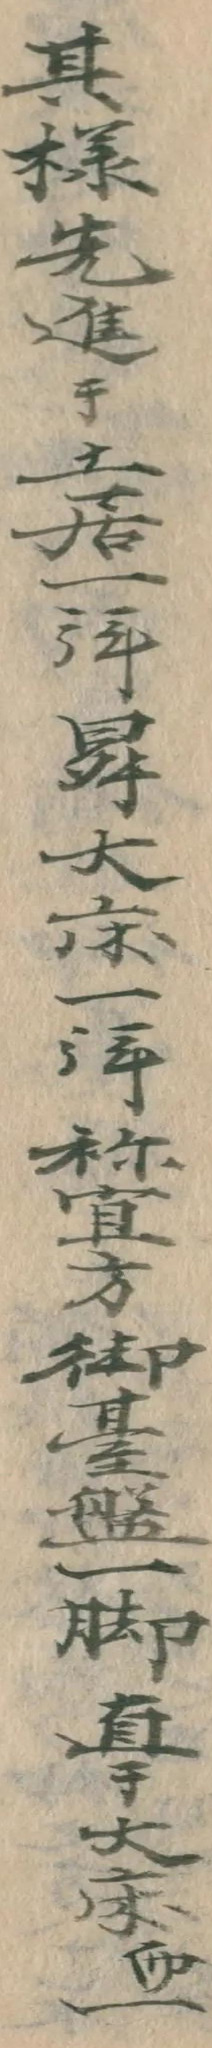其様先進于土居一拝昇大床一拝祢宜方御台盤一脚直于大床而一
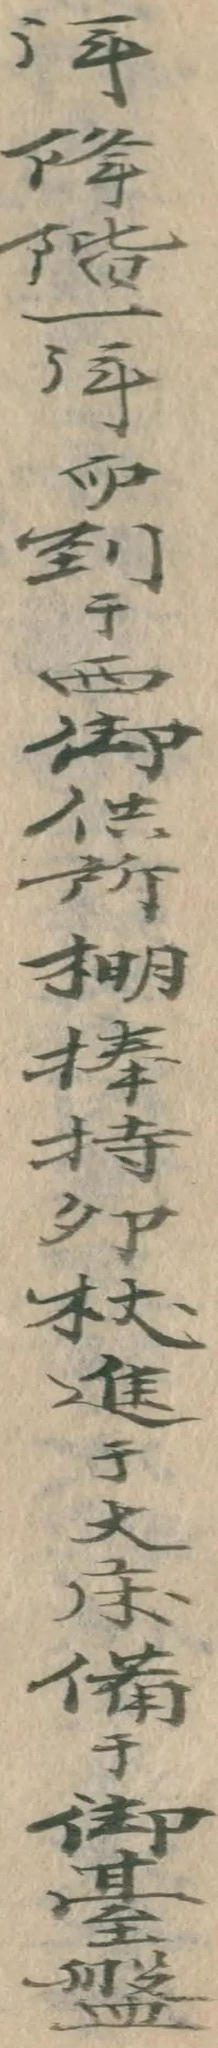拝降階一拝而到于西御供所棚捧持卯杖進于大床備于御台盤
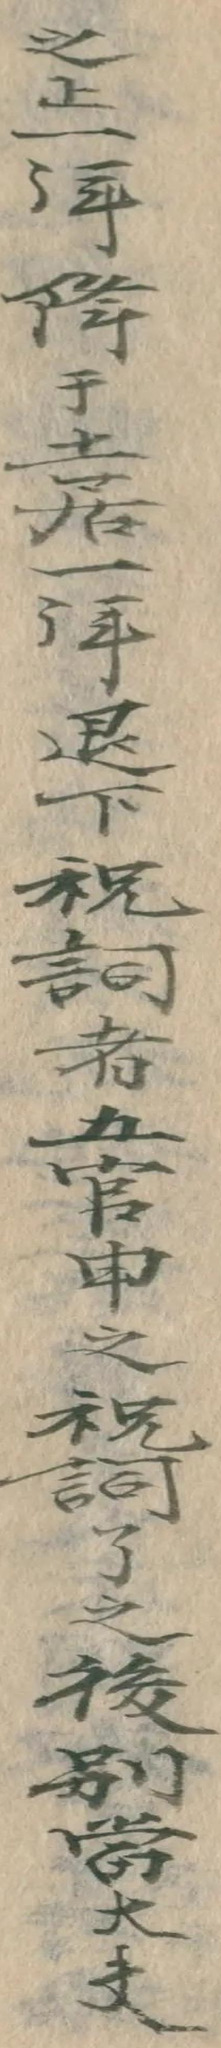之上一拝降于土居一拝退下祝詞者五官申之祝詞了之後別当大夫
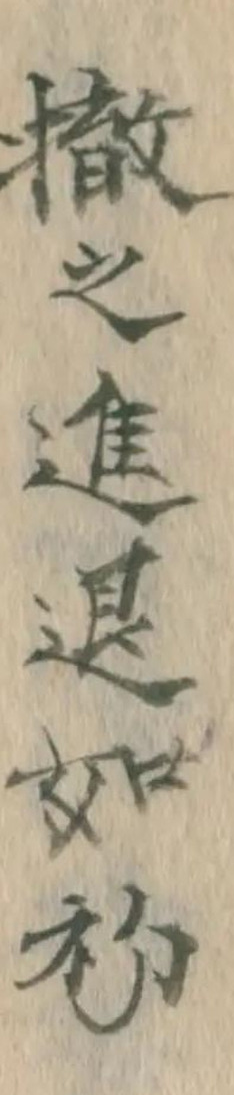撤之進退如初
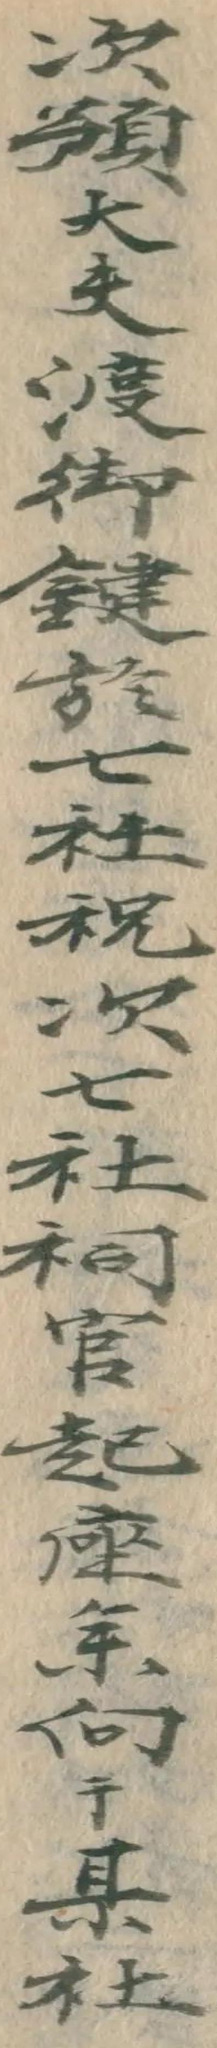次預大夫渡御鍵於七社祝次七社祠官起座参向于某社
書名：賀茂社記録. 第9冊
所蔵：国立国会図書館 National Diet Library, JAPAN
